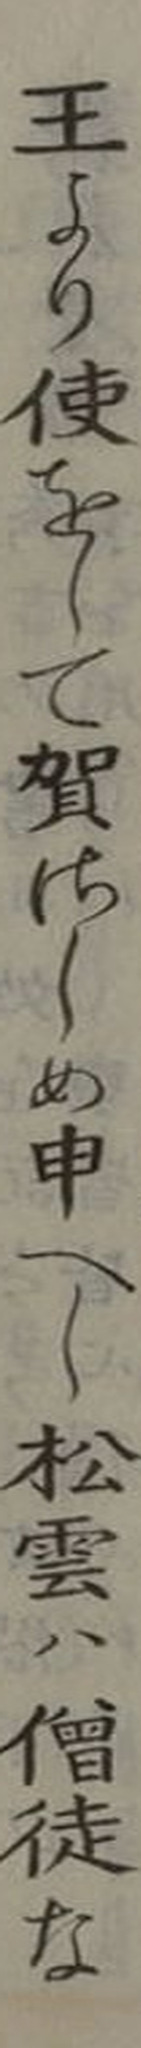王より使をして賀さしめ申へし松雲ハ僧徒な
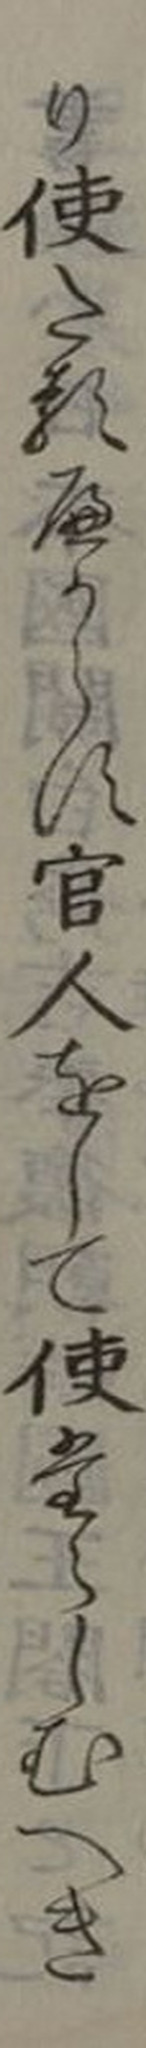り使たるへからす官人をして使たらしむへき
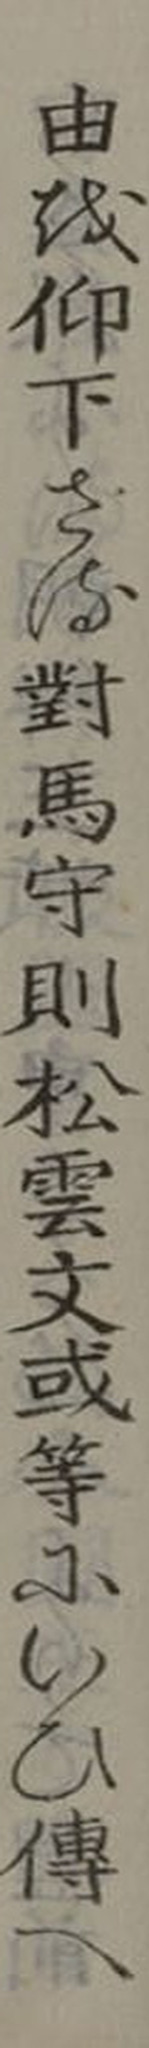由を仰下さる對馬守則松雲文或等にいひ傳へ
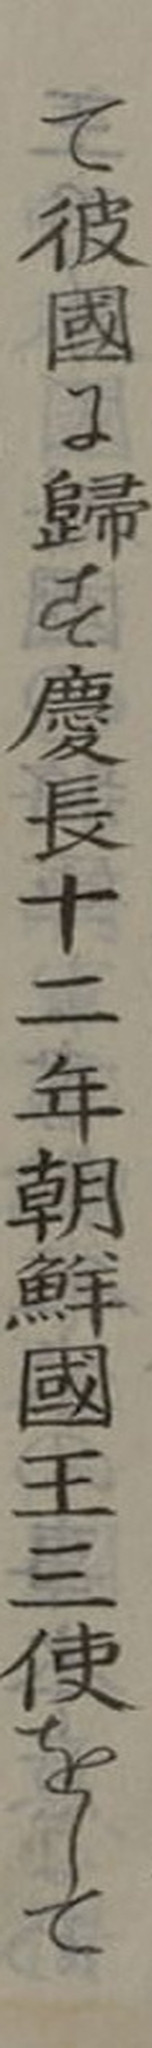て被國に歸す慶長十二年朝鮮國王三使をして
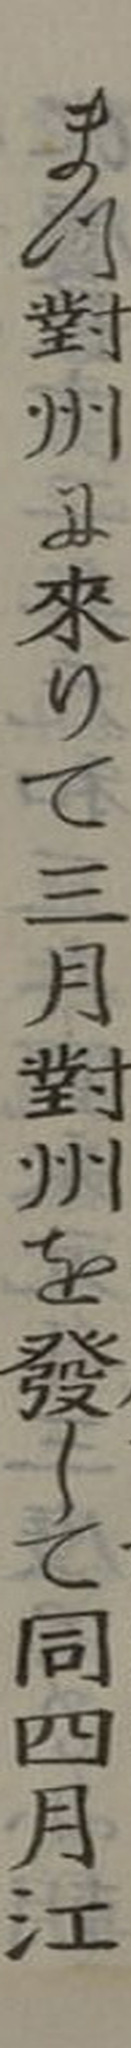まつ對州に來りて三月對州を發して同四月江
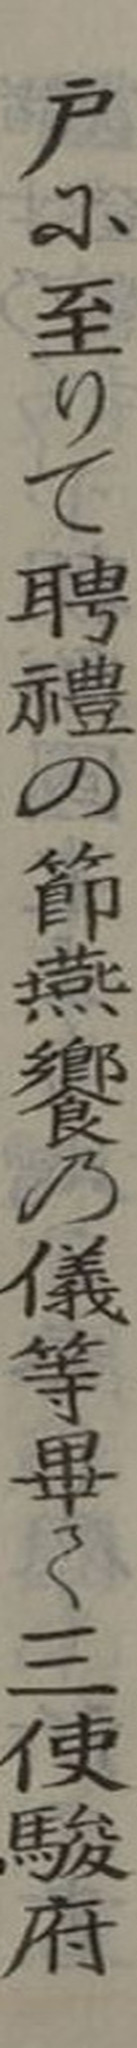戸に至りて聘禮の節燕饗の儀等畢て三使駿府
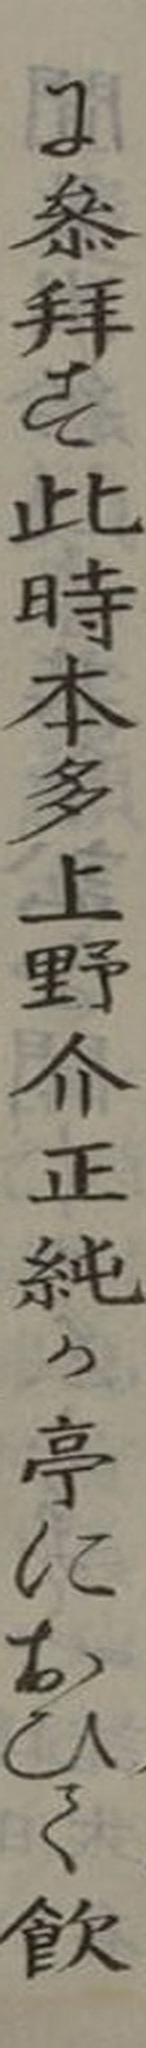に叅拜す此時本多上野介正純か亭におひて飲
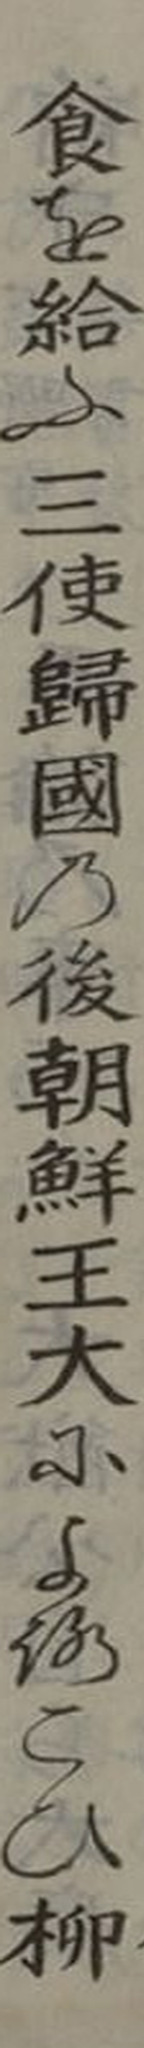食を給ふ三使歸國の後朝鮮王大によろこひ柳
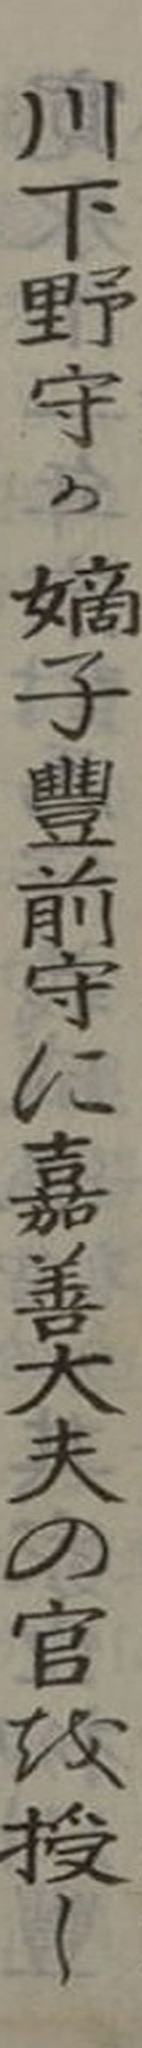川下野守の嫡子豐前守に嘉善大夫の官を授し
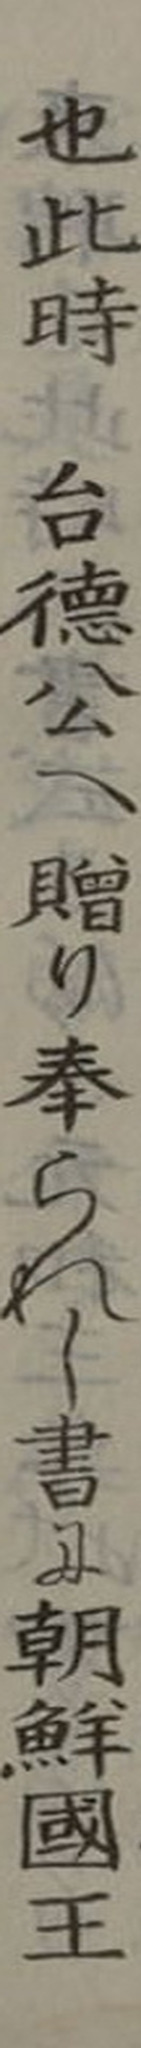也此時台德公へ贈り奉られし書に朝鮮國王
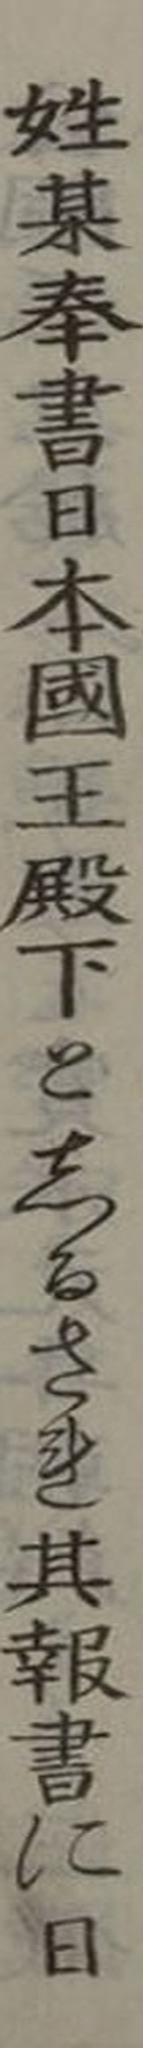姓某奉書日本國王殿下としるされ其報書に日
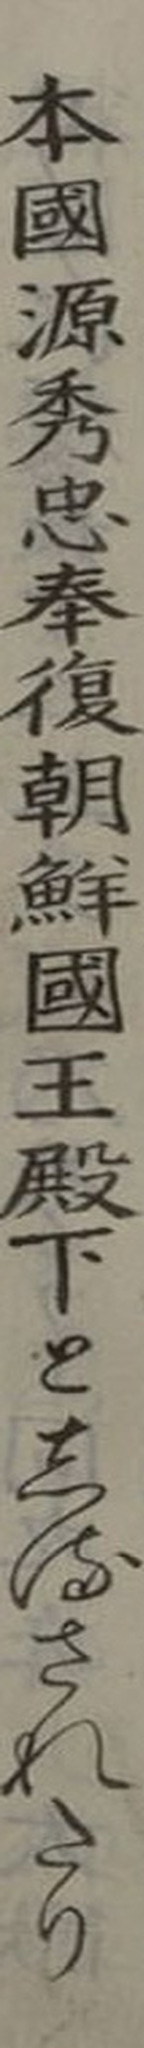本國源秀忠奉復朝鮮國王殿下としるされたり
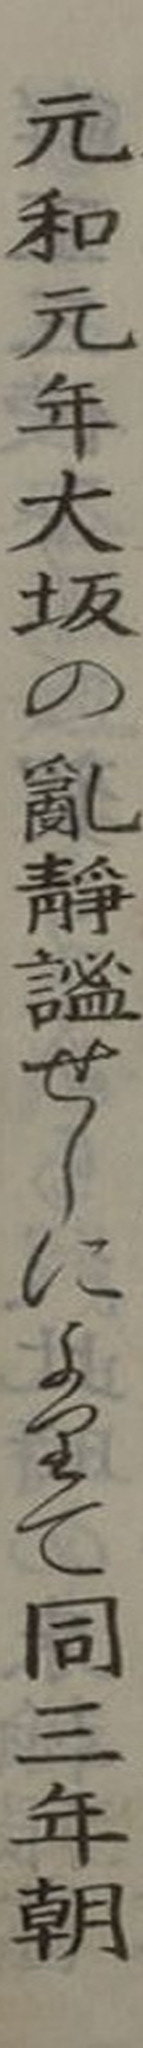元和元年大坂の亂静謐せしによりて同三年朝

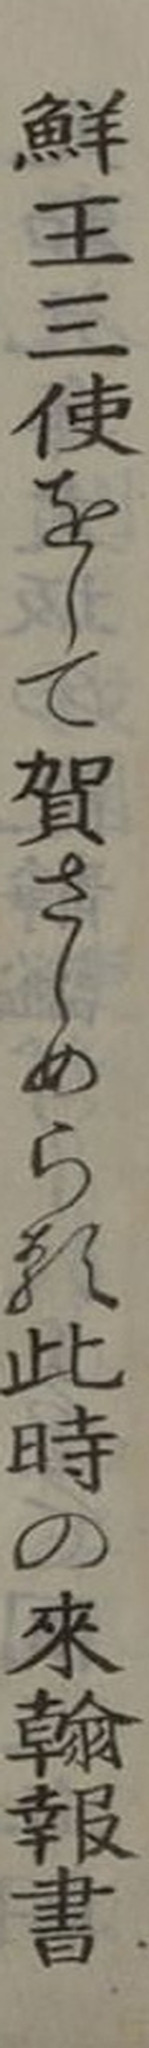鮮王三使をして賀さしめられ此時の來翰報書
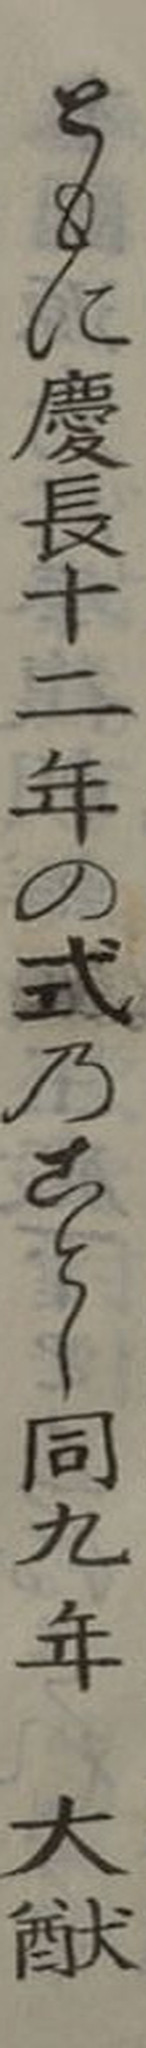ともに慶長十二年の式のことし同九年大猷
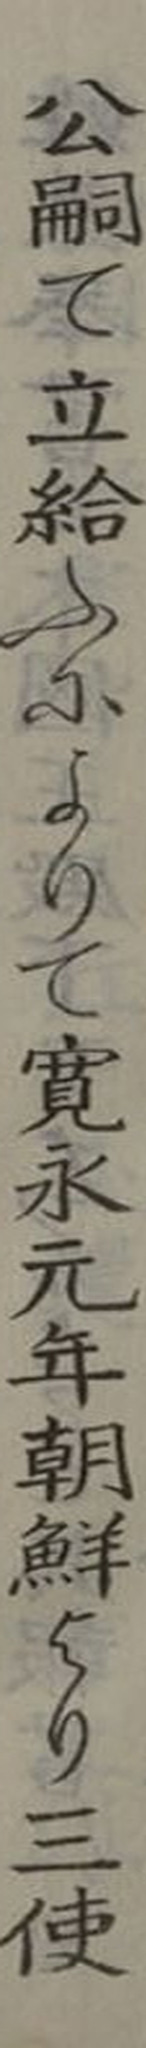公嗣て立給ふによりて寛永元年朝鮮より三使
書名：骨董録
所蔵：University of the Ryukyus Library
